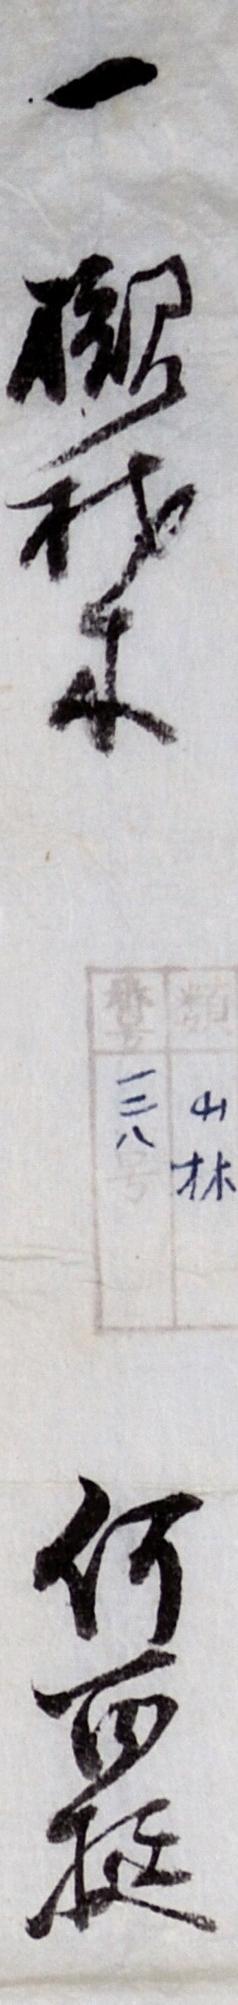一槻材木何百挺
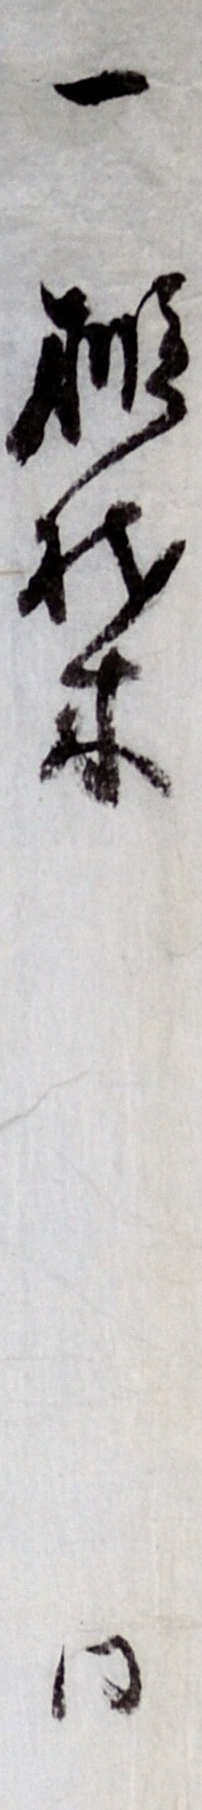一椴材木同
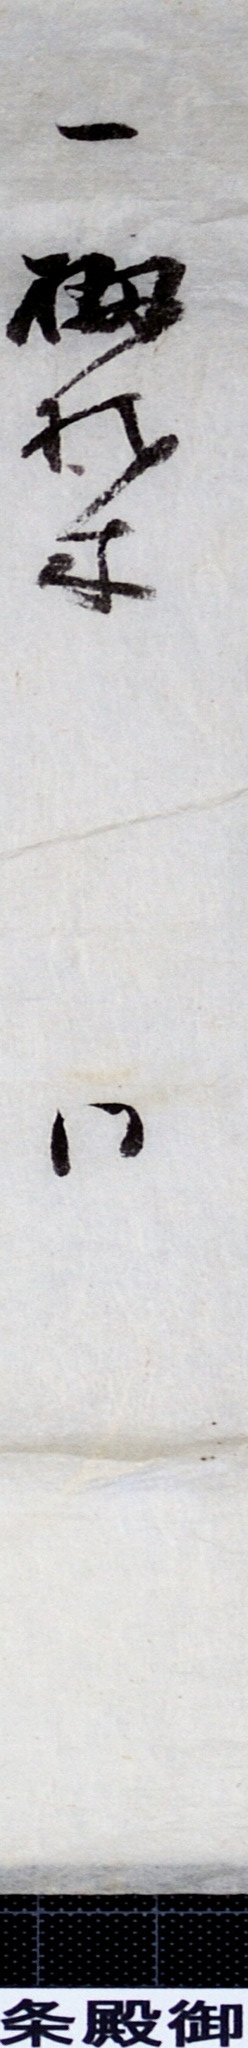一栂材木同
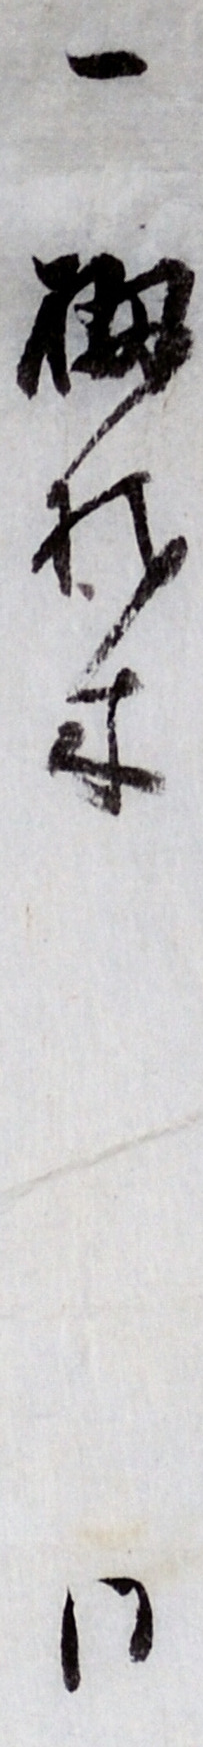一栂材木同
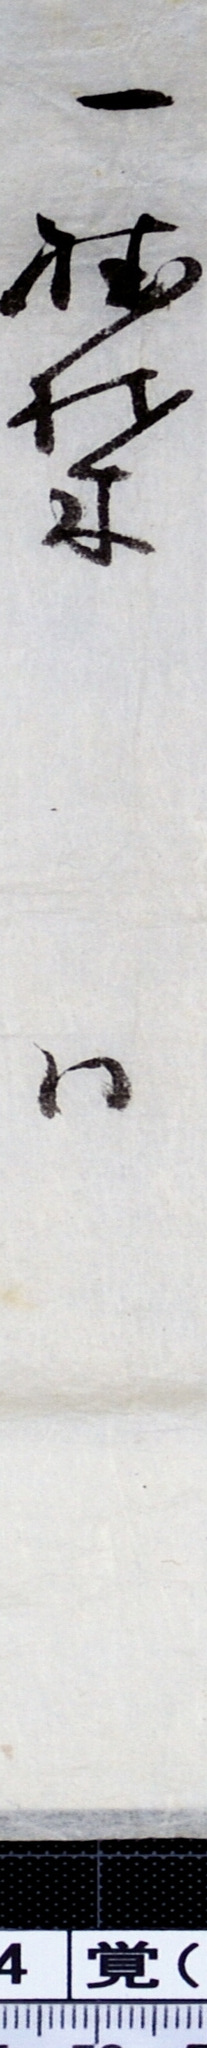一椴材木同
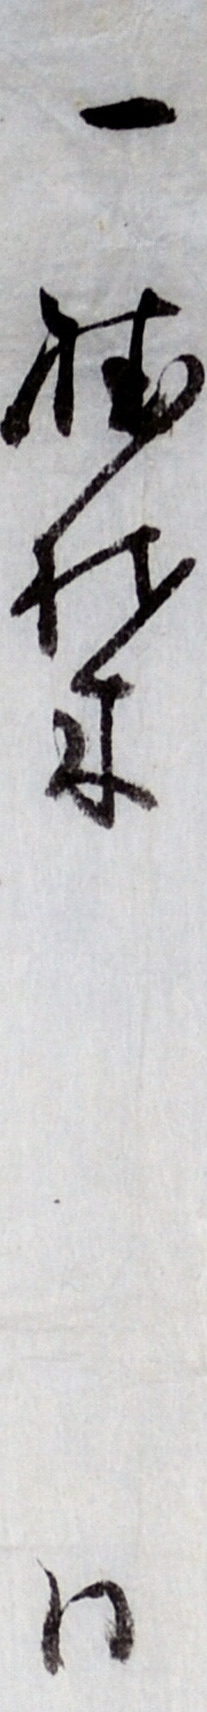一椴材木同
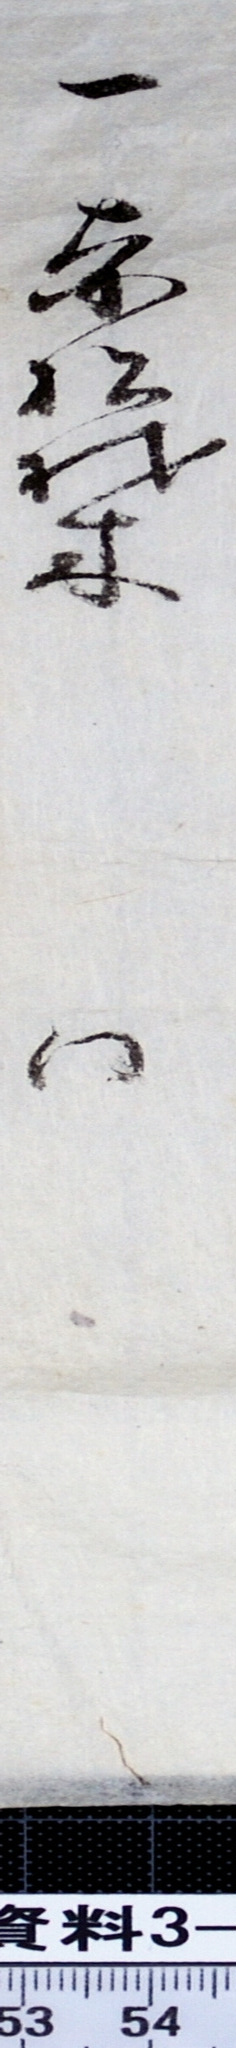一赤松材木同
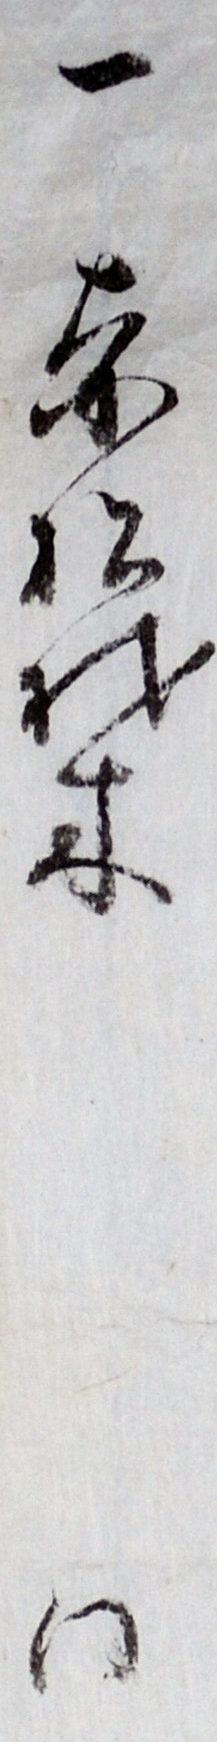一赤松材木同
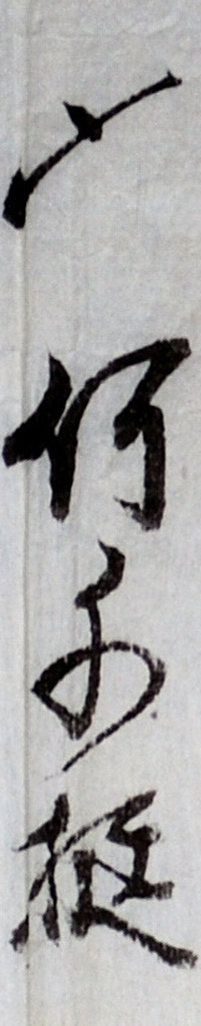〆何千挺
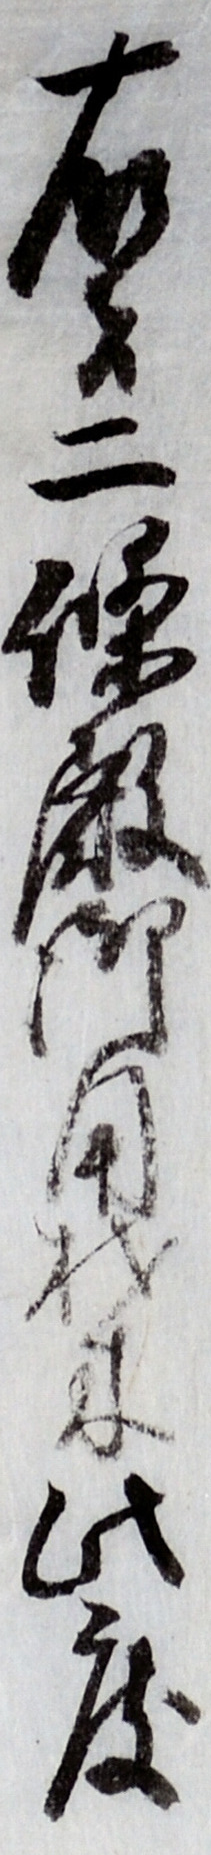右者二條殿御用材木此度
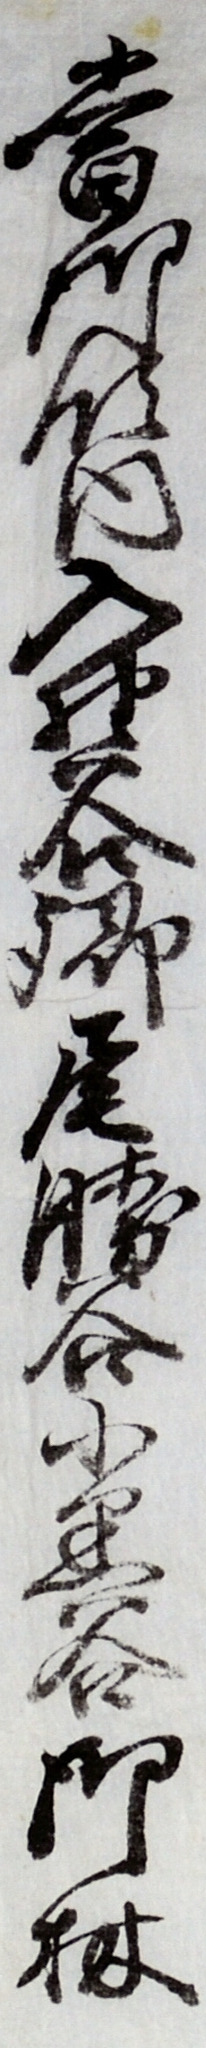当御領内入野谷郷尾勝谷小黒谷御林
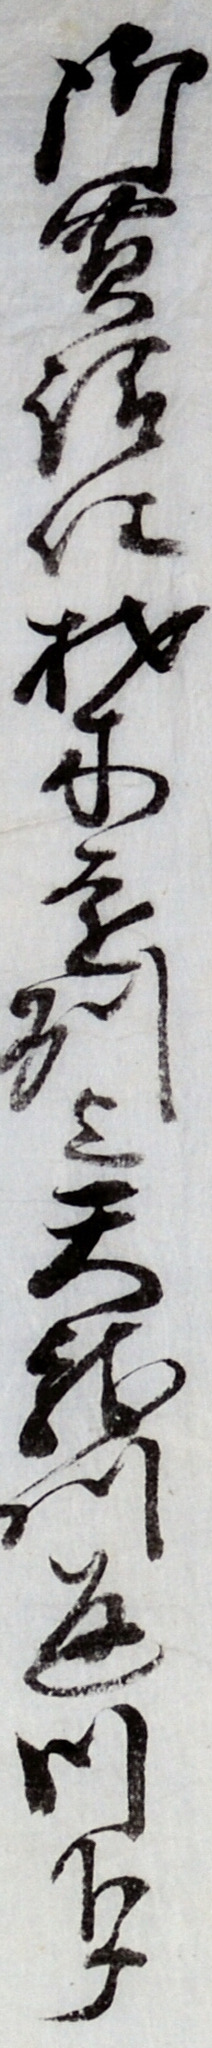御買請仕材木遠州迄天龍川通川下ケ
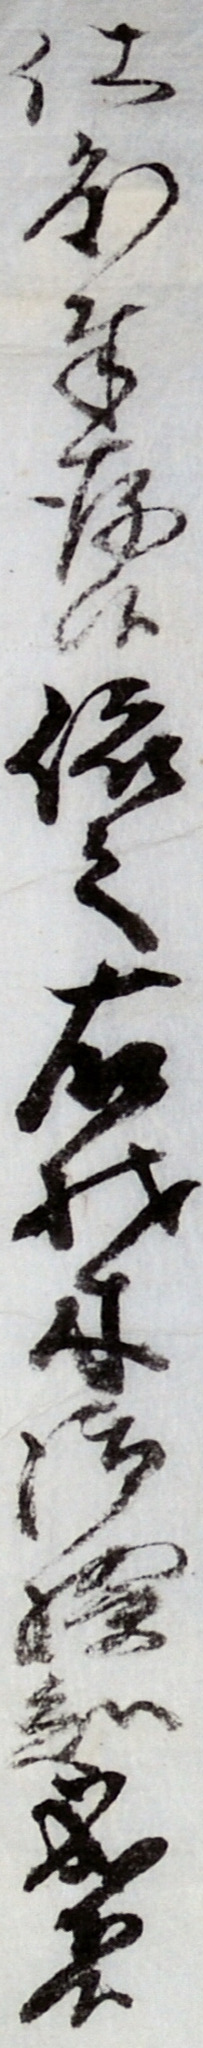仕度奉存候依之右材木御探知被成下候
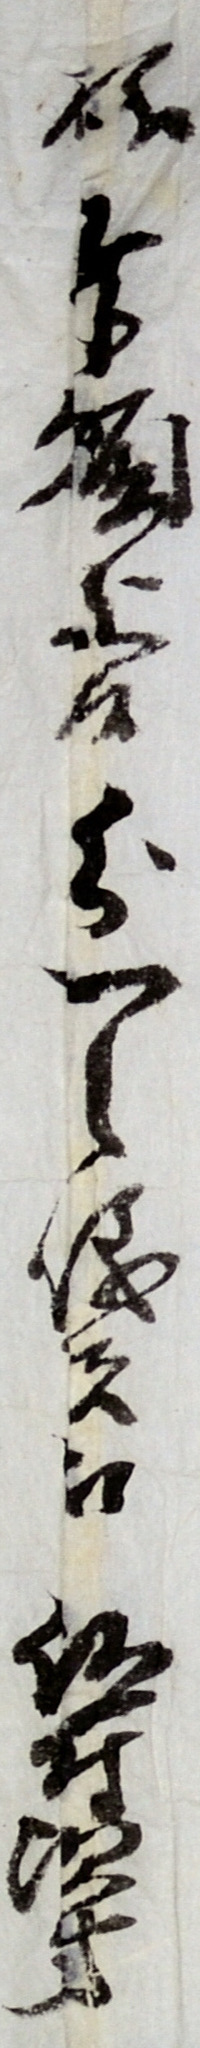様奉願上候分口之儀者被仰付次第
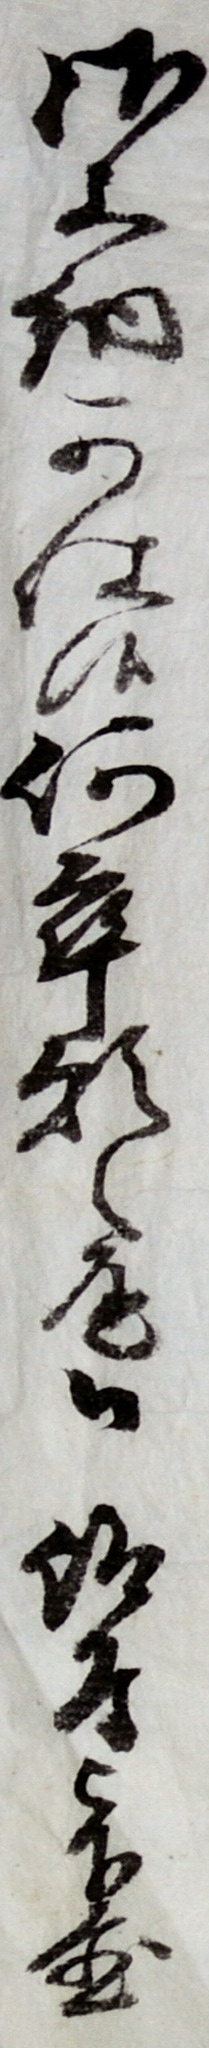御上納可仕候、何卒願之通被仰付被下置

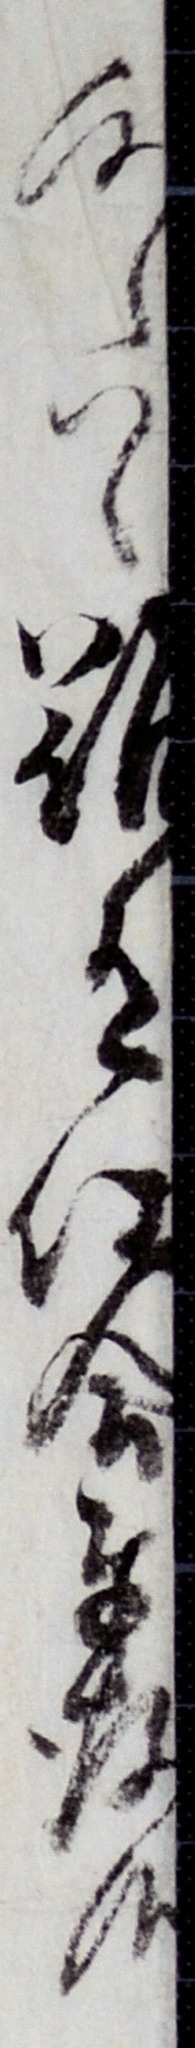候はゝ難有仕合奉存候
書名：覚
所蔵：伊那市立高遠町図書館・合同会社AMANE
